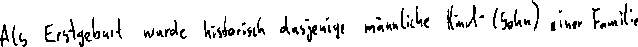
Als Erstgeburt wurde historisch dasjenige männliche Kind (Sohn) einer Familie
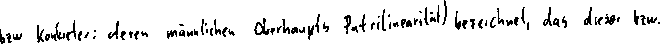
bzw. konkreter: deren männlichen Oberhaupts Patrilinearität) bezeichnet, das dieser bzw.
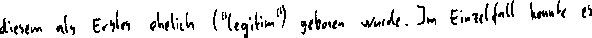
diesem als Erstes ehelich ("legitim") geboren wurde. Im Einzelfall konnte es
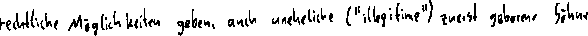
rechtliche Möglichkeiten geben, auch uneheliche ("illegitime") zuerst geborene Söhne
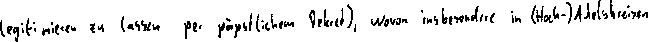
legitimieren zu lassen per päpstlichem Dekret), wovon insbesondere in (Hoch-)Adelskreisen
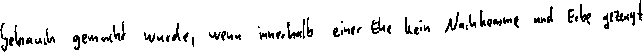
Gebrauch gemacht wurde, wenn innerhalb einer Ehe kein Nachkomme und Erbe gezeugt
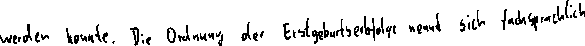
werden konnte. Die Ordnung der Erstgeburtserbfolge nennt sich fachsprachlich
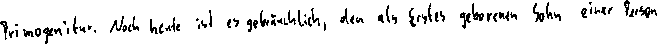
Primogenitur. Noch heute ist es gebräuchlich, den als Erstes geborenen Sohn einer Person
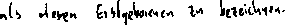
als deren Erstgeborenen zu bezeichnen.
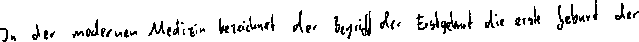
In der modernen Medizin bezeichnet der Begriff Erstgeburt die erste Geburt der
